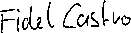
Fidel Castro
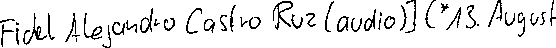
Fidel Alejandro Castro Ruz ( audio)] (* 13. August
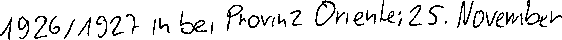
1926/1927 in bei Provinz Oriente; 25. November
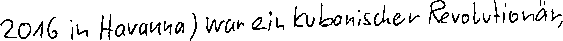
2016 in Havanna) war ein kubanischer Revolutionär,
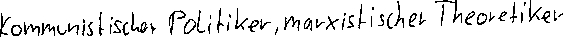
kommunistischer Politiker, marxistischer Theoretiker
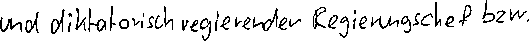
und diktatorisch regierender Regierungschef bzw.
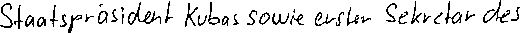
Staatspräsident Kubas sowie erster Sekretär des
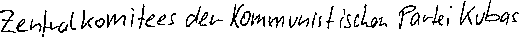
Zentralkomitees der Kommunistischen Partei Kubas
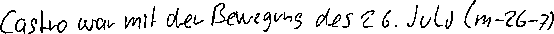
Castro war mit der Bewegung des 26. Juli (M-26-7)
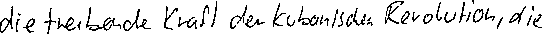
die treibende Kraft der kubanischen Revolution, die
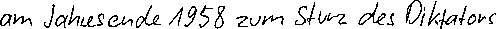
am Jahresende 1958 zum Sturz des Diktators
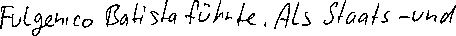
Fulgencio Batista führte. Als Staats- und
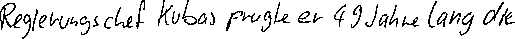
Regierungschef Kubas prägte er 49 Jahre lang die
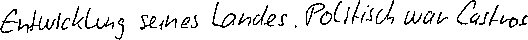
Entwicklung seines Landes. Politisch war Castros
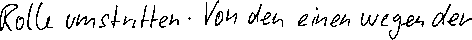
Rolle umstritten: Von den einen wegen der
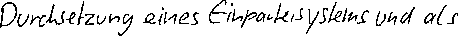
Durchsetzung eines Einparteiensystems und als
